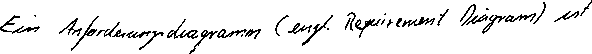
Ein Anforderungsdiagramm (engl. Requirement Diagram) ist
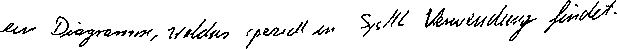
ein Diagramm, welches speziell in SysML Verwendung findet.
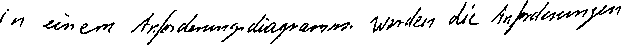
In einem Anforderungsdiagramm werden die Anforderungen
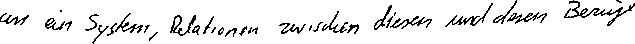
an ein System, Relationen zwischen diesen und deren Bezüge
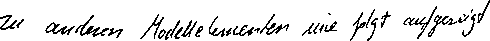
zu anderen Modellelementen wie folgt aufgezeigt.
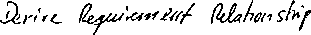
Derive Requirement Relationship
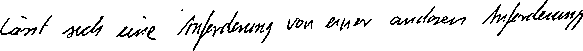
Lässt sich eine Anforderung von einer anderen Anforderung
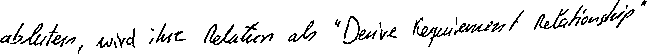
ableiten, wird ihre Relation als "Derive Requirement Relationship"
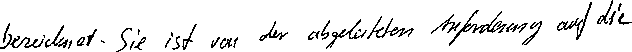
bezeichnet. Sie ist von der abgeleiteten Anforderung auf die
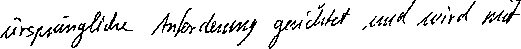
ursprüngliche Anforderung gerichtet und wird mit
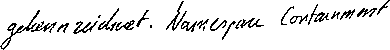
gekennzeichnet.Namespace Containment
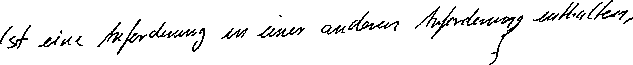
Ist eine Anforderung in einer anderen Anforderung enthalten,
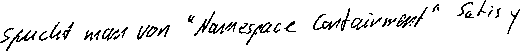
spricht man von "Namespace Containment".Satisfy
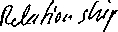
Relationship
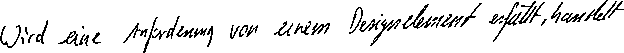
Wird eine Anforderung von einem Designelement erfüllt, handelt
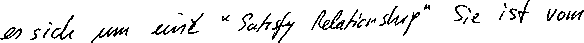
es sich um eine "Satisfy Relationship". Sie ist vom
